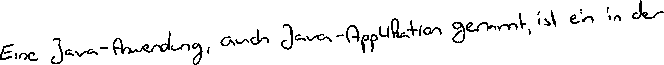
Eine Java-Anwendung, auch Java-Applikation genannt, ist ein in der
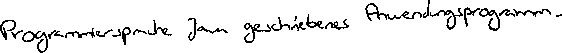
Programmiersprache Java geschriebenes Anwendungsprogramm.
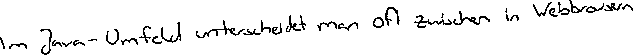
Im Java-Umfeld unterscheidet man oft zwischen in Webbrowsern
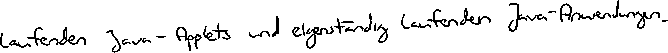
laufenden Java-Applets und eigenständig laufenden Java-Anwendungen.
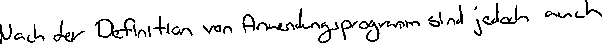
Nach der Definition von Anwendungsprogramm sind jedoch auch
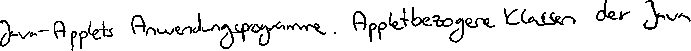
Java-Applets Anwendungsprogramme. Appletbezogene Klassen der Java
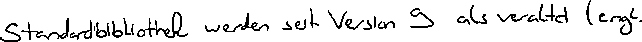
Standardbibliothek werden seit Version 9 als veraltet (engl.
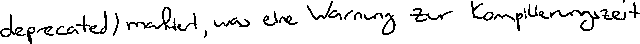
deprecated) markiert, was eine Warnung zur Kompilierungszeit
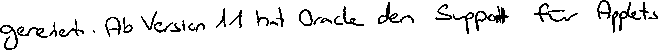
generiert. Ab Version 11 hat Oracle den Support für Applets
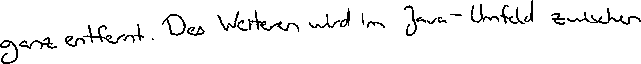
ganz entfernt.Des Weiteren wird im Java-Umfeld zwischen
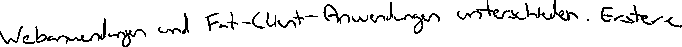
Webanwendungen und Fat-Client-Anwendungen unterschieden. Erstere
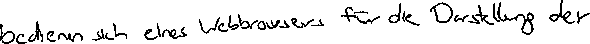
bedienen sich eines Webbrowsers für die Darstellung der
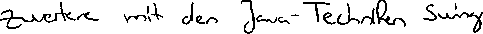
mit den Java-Techniken Swing
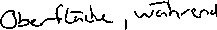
Oberfläche, während
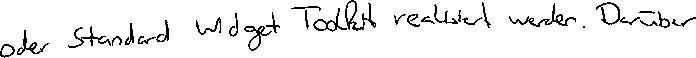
oder Standard Widget Toolkit realisiert werden. Darüber
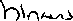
hinaus
